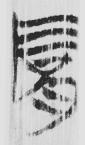{厂肙}
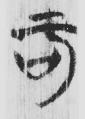可
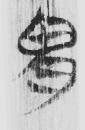胃
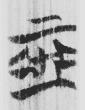亞
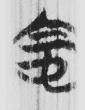{宀𠁩}
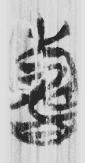壽
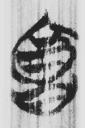會[合]
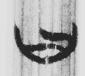曰
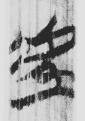𫊟
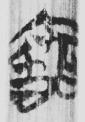{尒䎽}
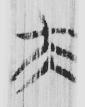夫
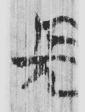長
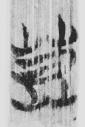莫
